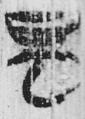○（夏）
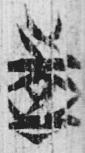臺
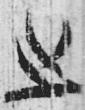之
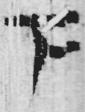下
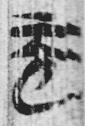而
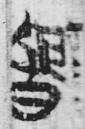{尒䎽}（問）
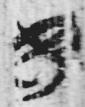𡚦（焉）
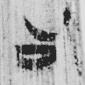曰
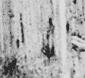九
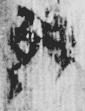邦
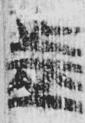者
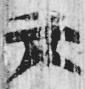亓（其）
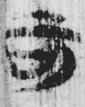可
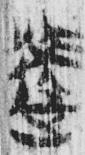○（來）
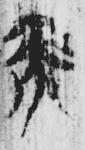{虍介}（乎）
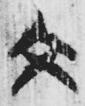文
